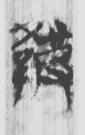{韋皮}
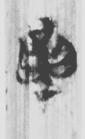革
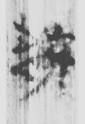歲
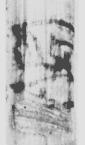{亟正}
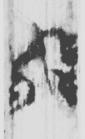飛
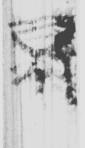鳥
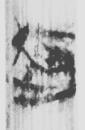趣
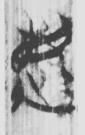{鹿止}
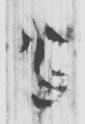水
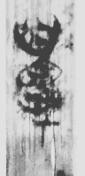鼠
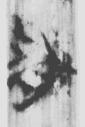歲
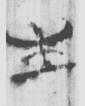生
